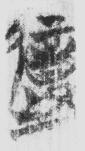復
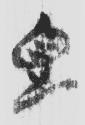見
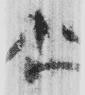少
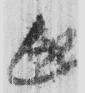臣
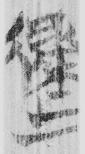{辶帚}
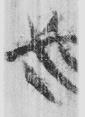必
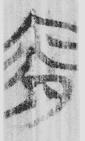夜
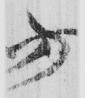方
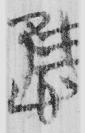惟
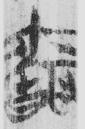{尒䎽}
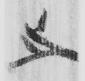之
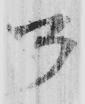乃
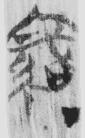{糸竹咸}
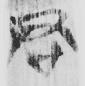君
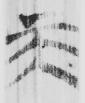天
